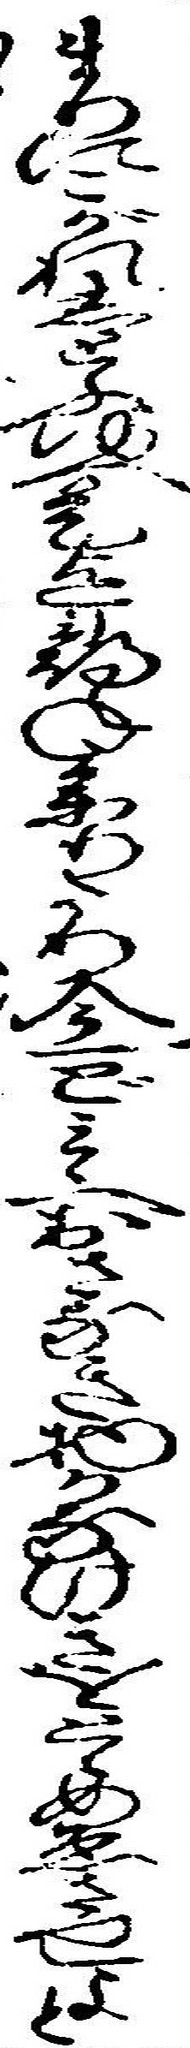まりにこがれしとふゆへ是迄尋ね参りたり今一どみゝへおさなき物かなけきをとゝめゑさせよと
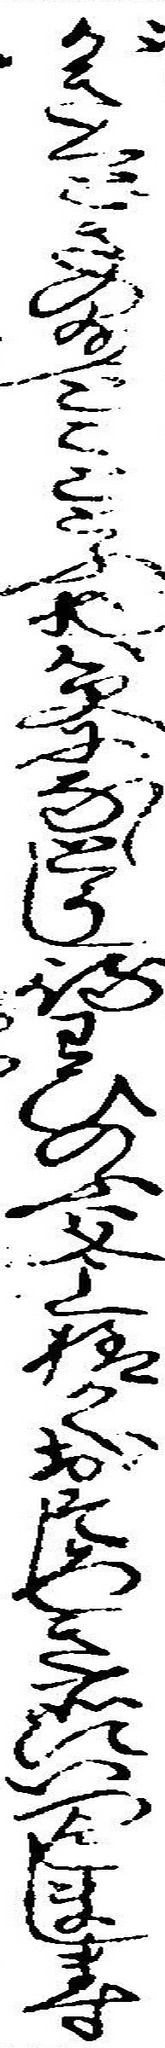ふしかきくどきの給へとこととふ物は更になしとうし待わひのふ父上様かくおそろしき所にいつ迄まします
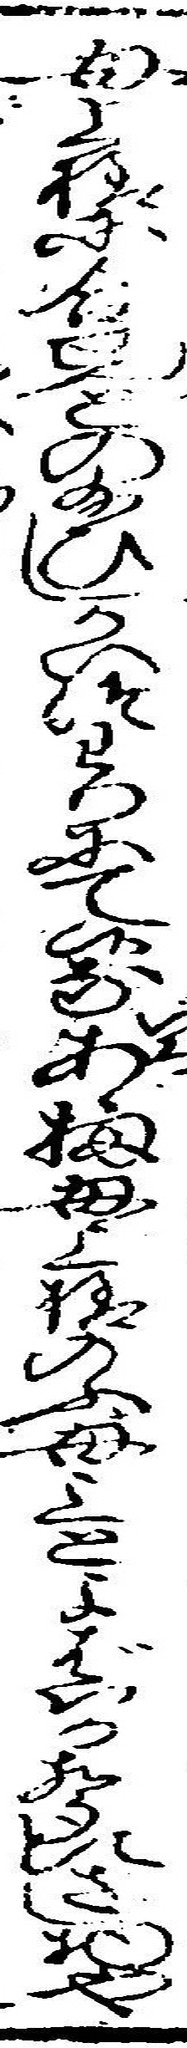母上様に合せんとの給ひしかいつわりにて候ないろあゝ扨母上様のふ母上とよばはる声にさし物や
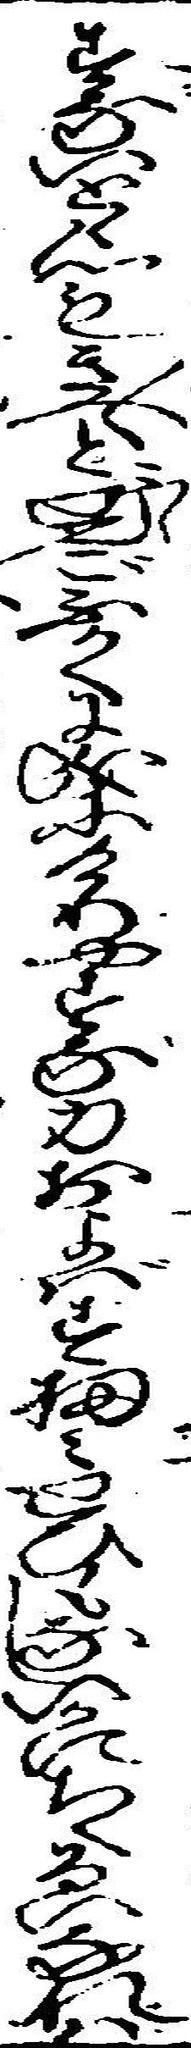すないとゝ心もきへ〳〵とふしせんごふかくに成にけりやすな力およばす扨々ぜひもなしいかにちくるいなれは
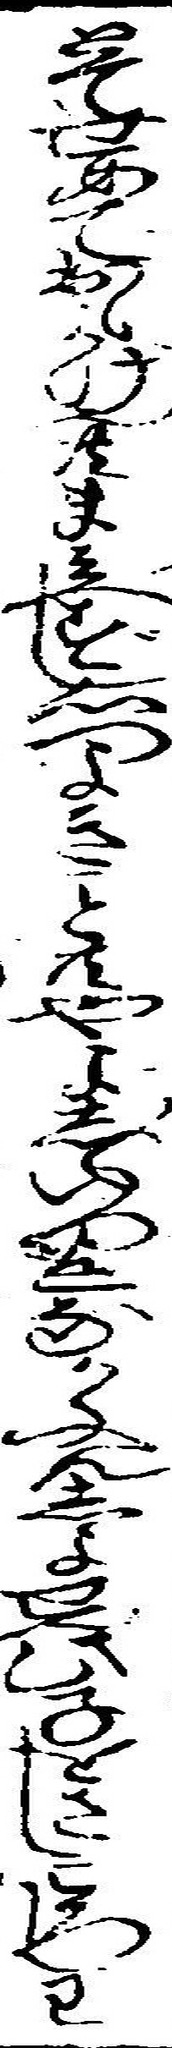とてせめておもかげ也共まみへずし心つよきこと共やよし〳〵いつ迄なからへんしよせん此子をさしころしわ
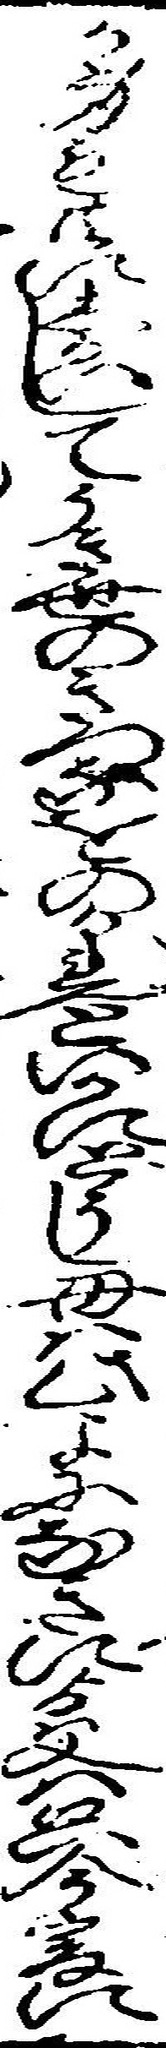か身も共にしかいしてうき世のきつなをのかれんといかにとうし母は此よになきにゟ父は只今爰に
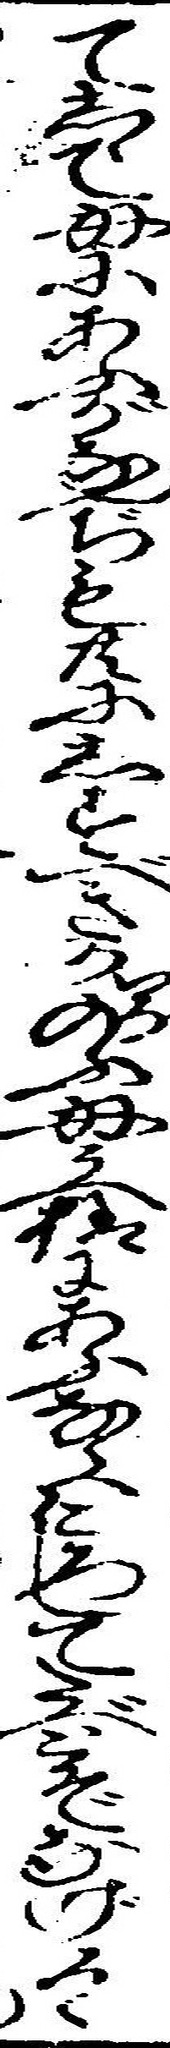てしゝて母にあふがなんぢも共にしすべきかいろのふ母うへ様にあふならはころしてたべとぞなげかるゝ
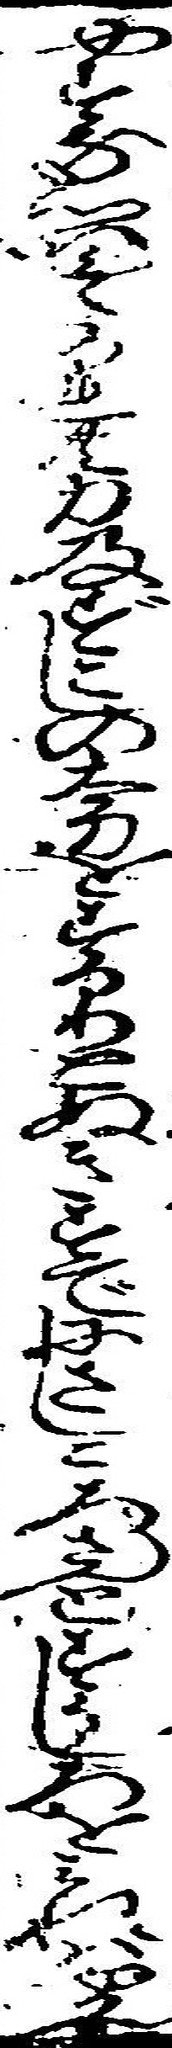やすな心はそかれ共力及ずこしの太刀をするりとぬきすでにさしころさんとすうしろをみればやかん
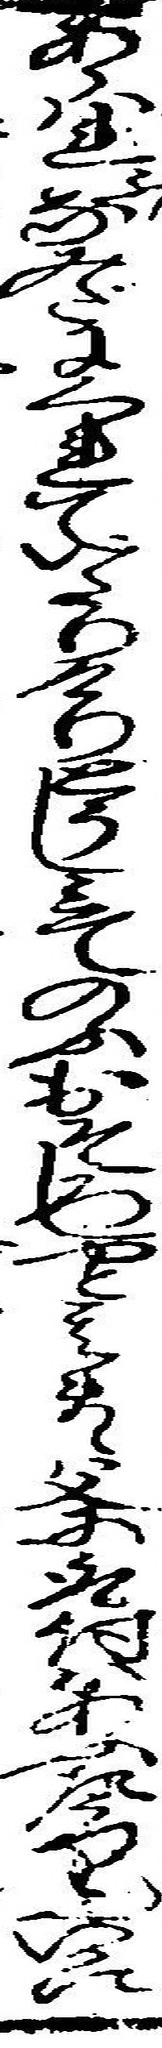あらはれふしなみだにくれていたりけりとうしみてのふおそろしやと其まゝ父に取付はあふたうり也いかに
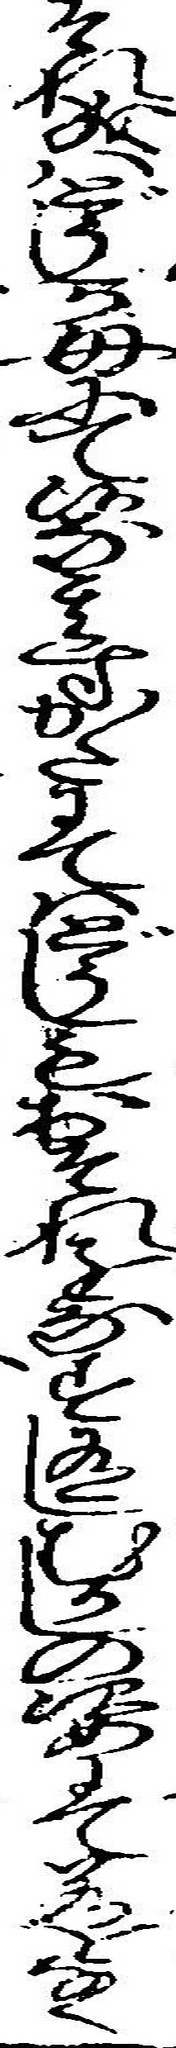それ成はどうしか母にて候な其すかたにてはどうしもおそれをなす有しむかしの姿にて若をなく
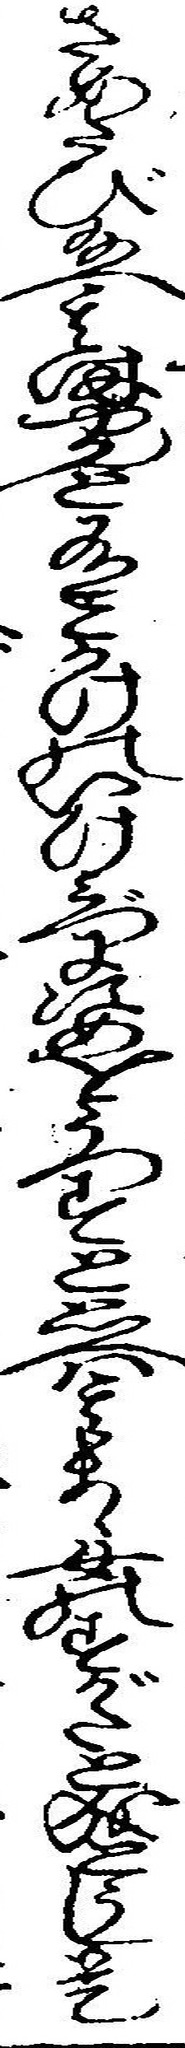さめたび給へ其時やかんと有こかけのいけみづに姿をうつすと思へは其まゝ女のすがたと成とうし是
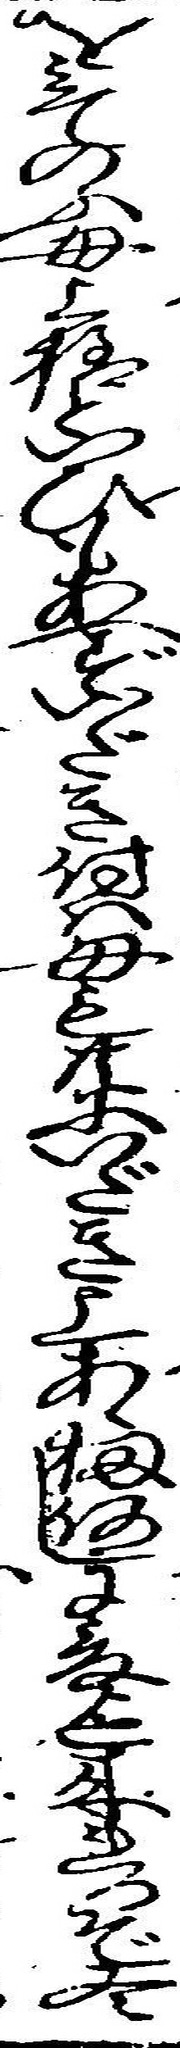をみてのふ母上様といひもあへずいだき付は母も共にいだき上あゝ扨何しに爰迄来れるぞ又々
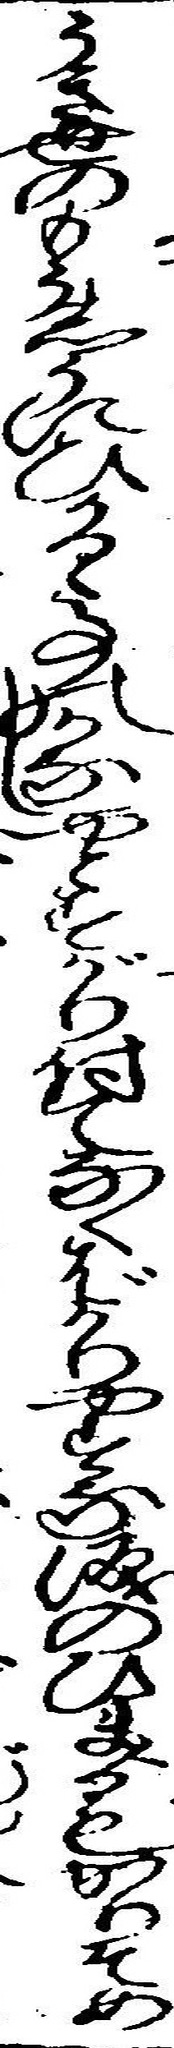うきよのもうしうにひかるゝ事のかなしやとすがり付てなくばかりやすな涙のひまゟもかりそめ
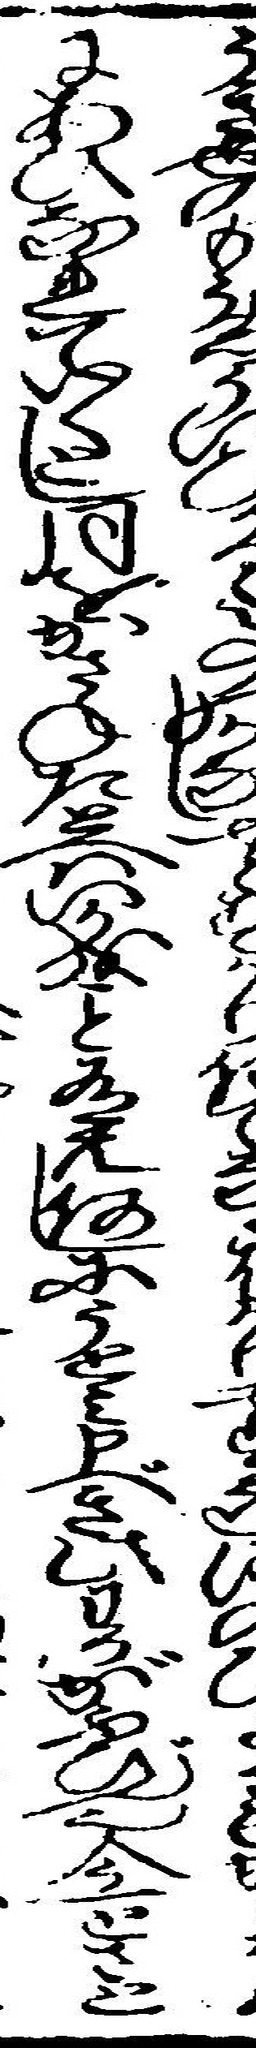にあひなれていくとし月をかさねたとへはいか成こと有共何しにうとみ申べき此わかがふびん也今一とさと
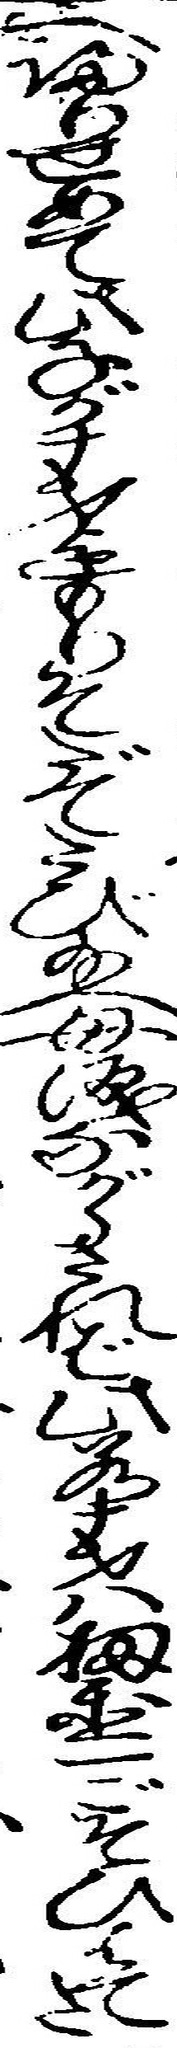へ帰りせめて此子が十才迄もりそだてたび給へ母涙ながしらされば此若十才は扨置一ごそひはてた
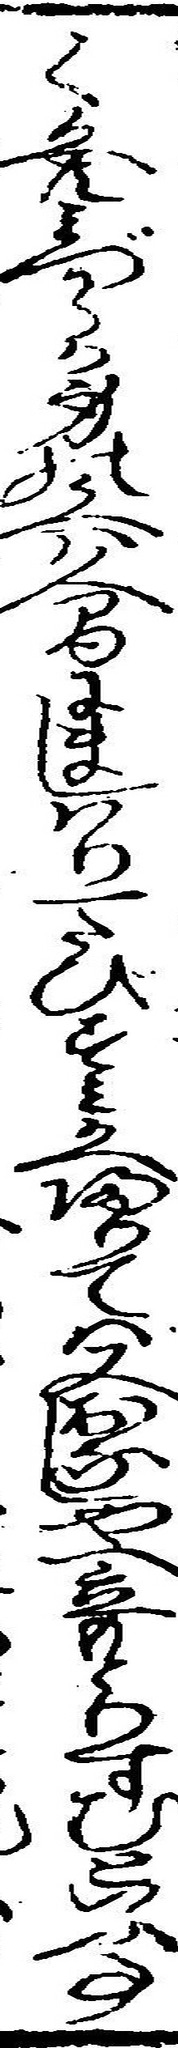く候へ共みづからか身のうへは人間にましはり一たびすみかへ帰りては又おなしやへ立もとりすむといふ事
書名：[しのだづまつりぎつね付あべの清明出生]
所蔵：東京大学総合図書館 General Library in the University of Tokyo, JAPAN
